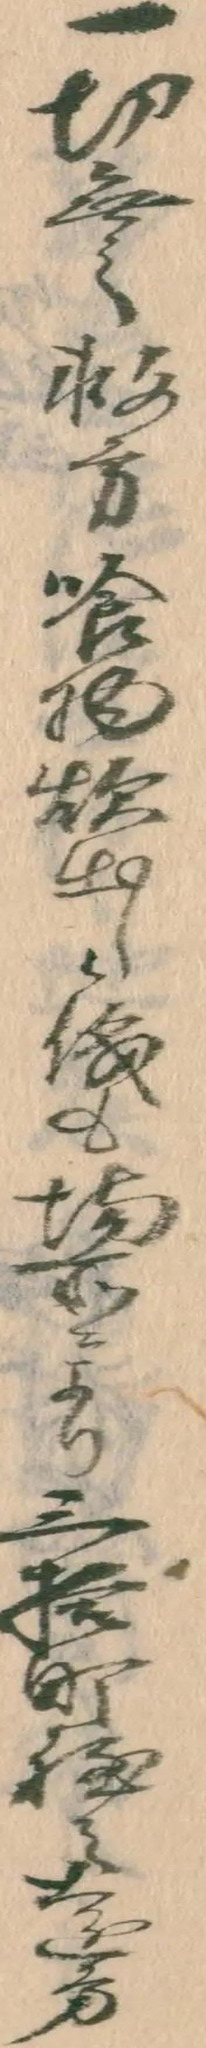一切無之救方喰物炊出候儀も場所二より三拾町程之遠方
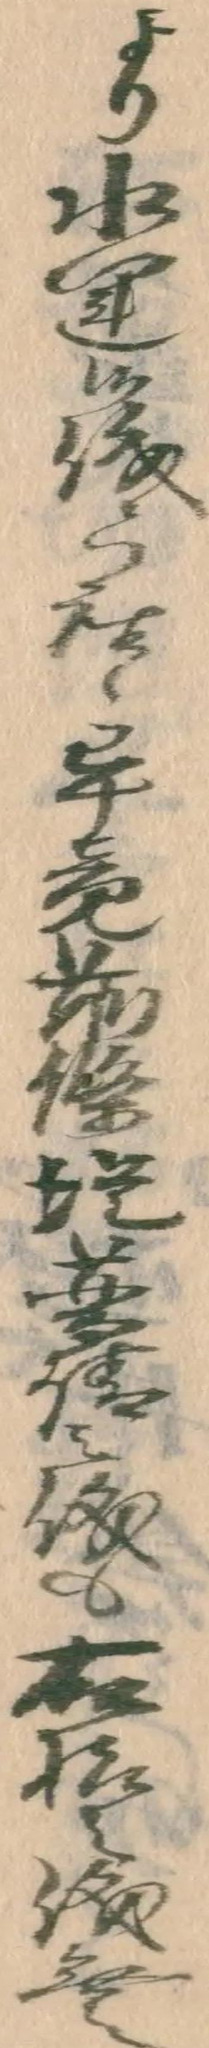ゟ水運候儀ニ御座候畢竟前条之堤普請之儀も右様之儀無之
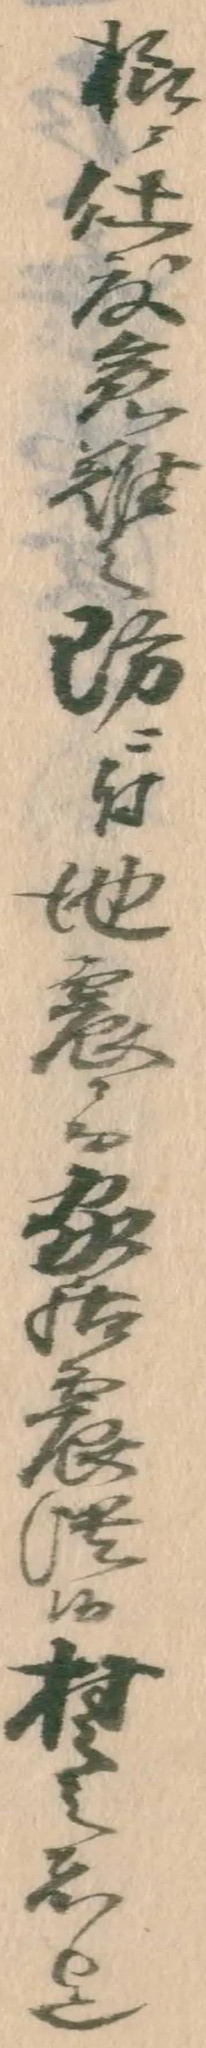様二仕度急難之防ニ付地震ニ而家居震潰候村々之者迄
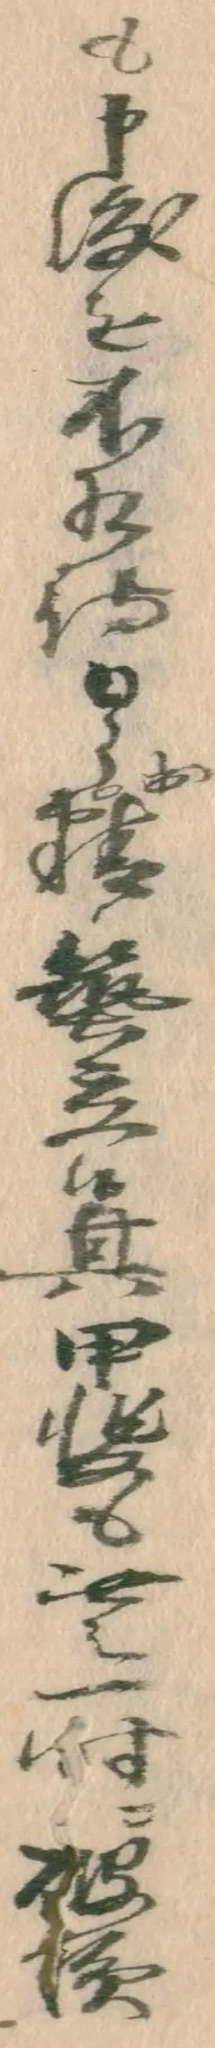も申渡を不相待日々出精築立其甲斐も無之一時ニ破損
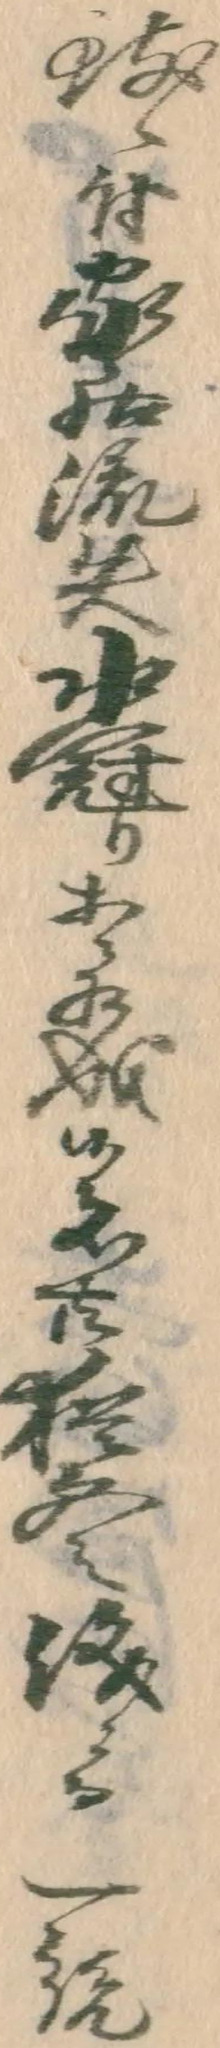致候付家居流失水冠り等二相成候者共ハ猶更之儀二而一統
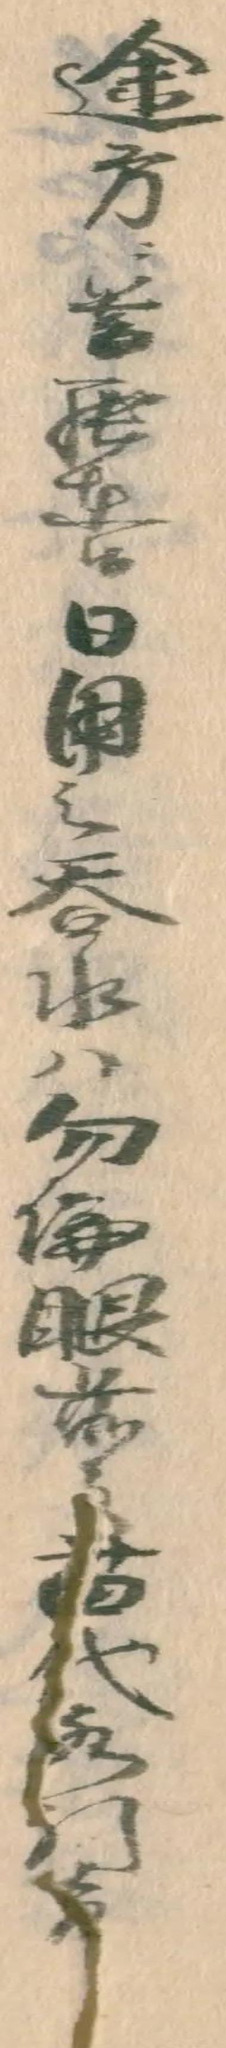途方ニ暮罷在候日用之呑水ハ勿論眼前之苗代水引方
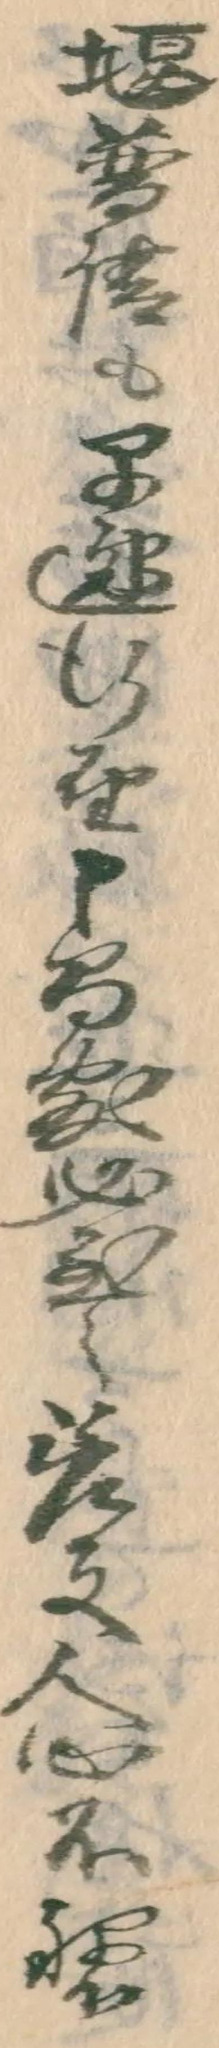堰普請も早速行届申間敷必至之差支人心不穏
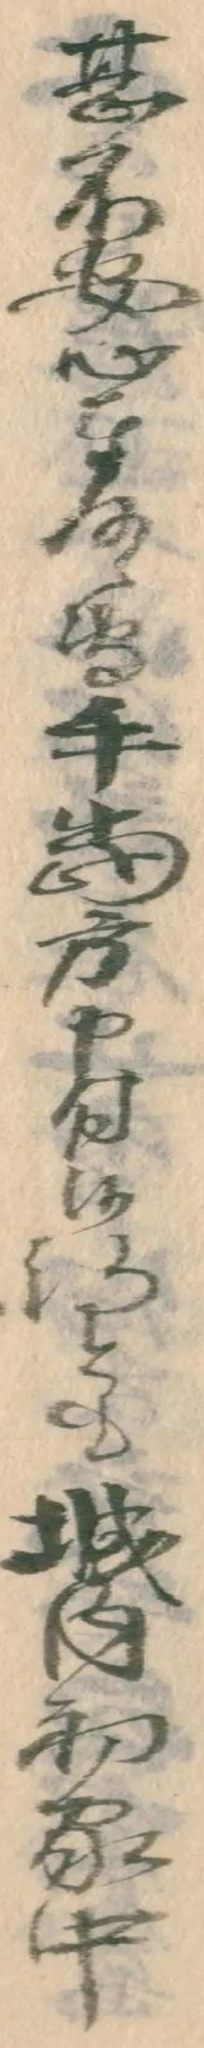甚不案心奉存候専手当方申付候得とも城内初家中
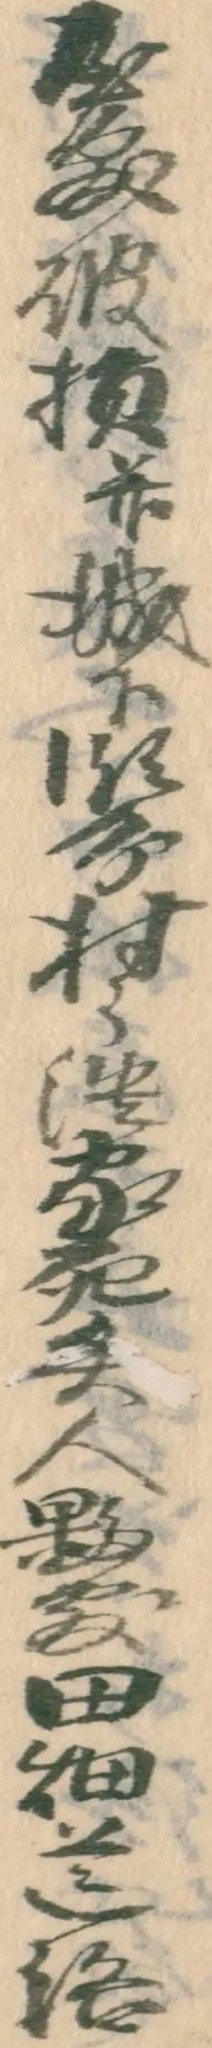屋敷破損并城下領分村々潰家死失人夥敷田畑道路

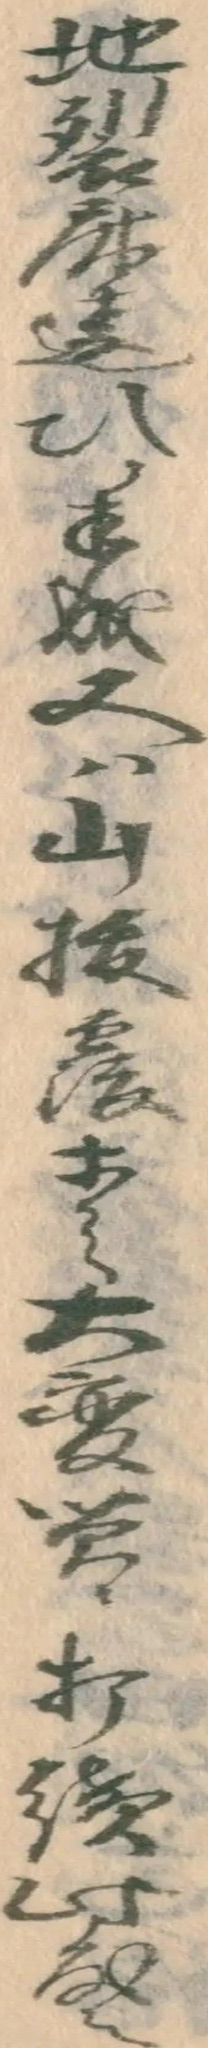地裂床違ひニ相成又ハ山抜覆等之大変災ニ打続此度之
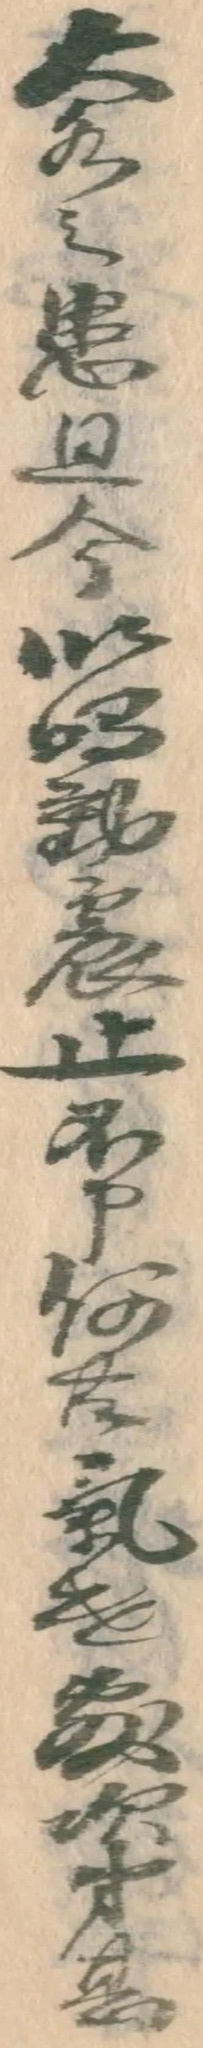大水之患且今以鳴動震止不申何共気遣敷次第甚
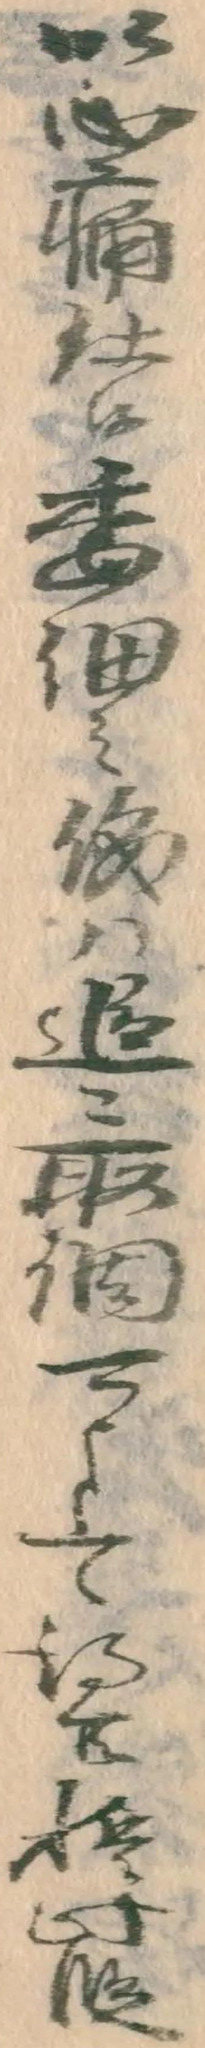以心痛仕候委細之儀ハ追々取調可申上候得共猶々此段
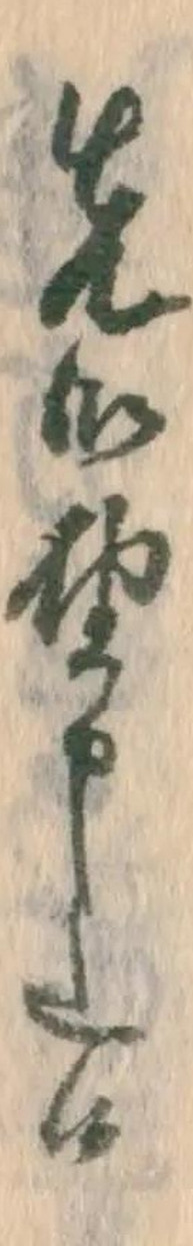先御届申上候
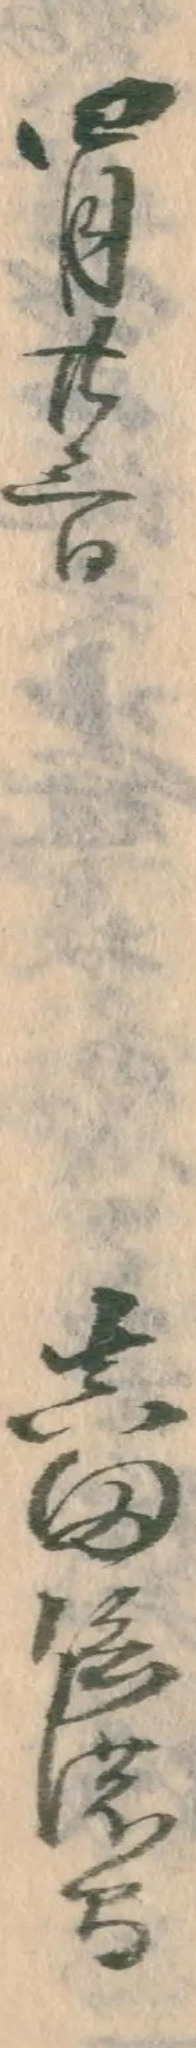四月廿三日真田信濃守
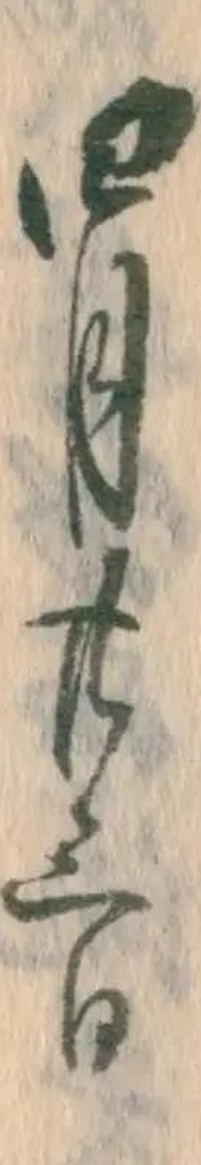四月廿三日
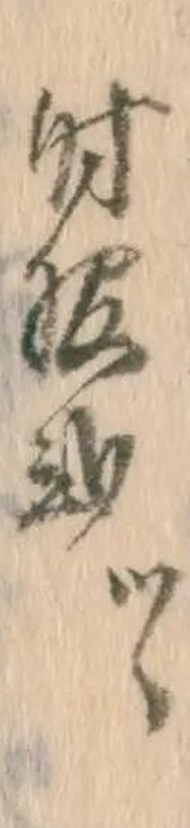時服弐ツッ
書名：信州大地震之記
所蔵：国立国会図書館 National Diet Library, JAPAN
